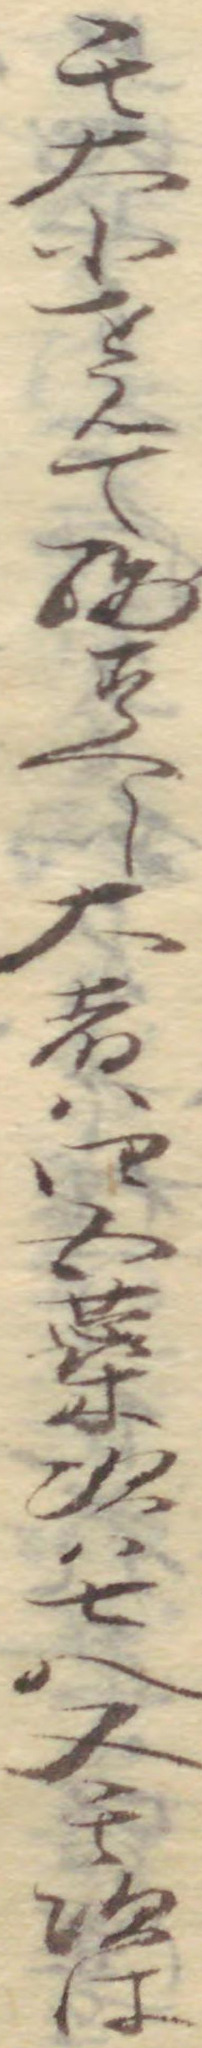其大小を見て残すへし大者ハ四五蘂次ハ七八又其次は
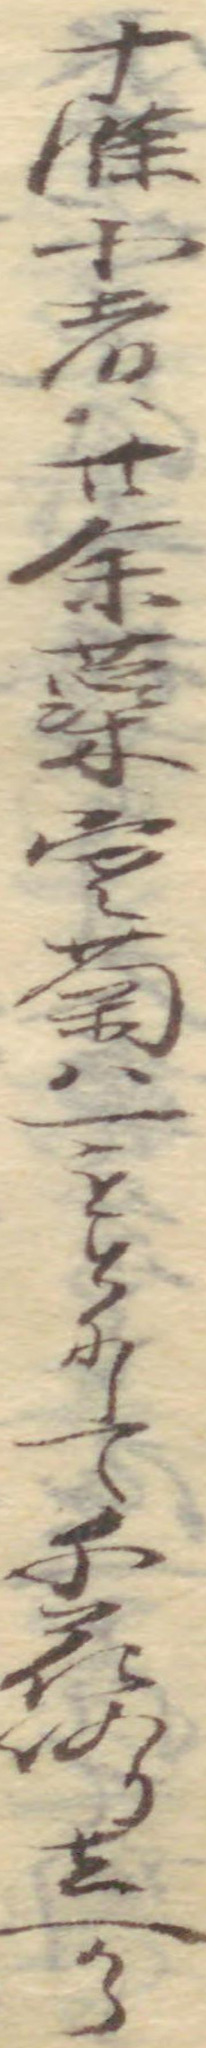十餘小者ハ廿余蘂寒菊ハ一もとにして千花あり去へから
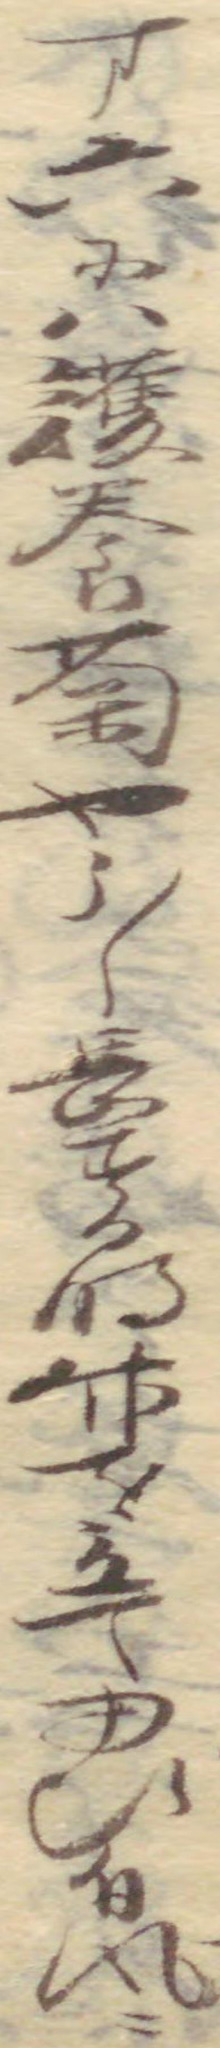す六にハ護養菊やう〳〵長する時竹を立てゆひ付風ニ
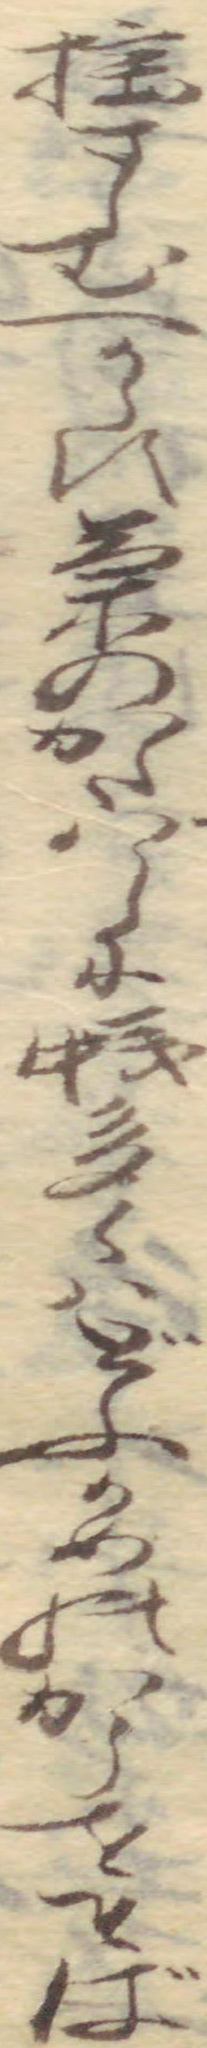揺さしむへからす菊のかたハしに蟻多くハどふかめのからをそば
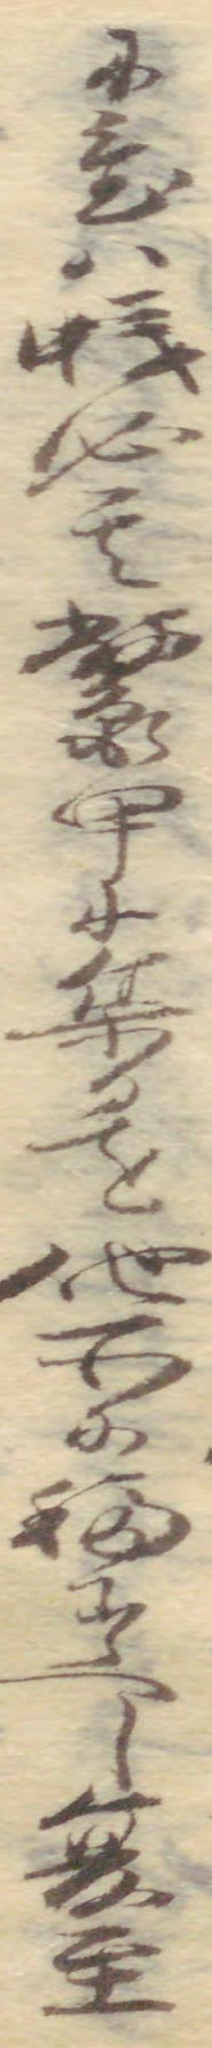に置ハ蟻必其鼇甲に集るを他所に移すへし夏至
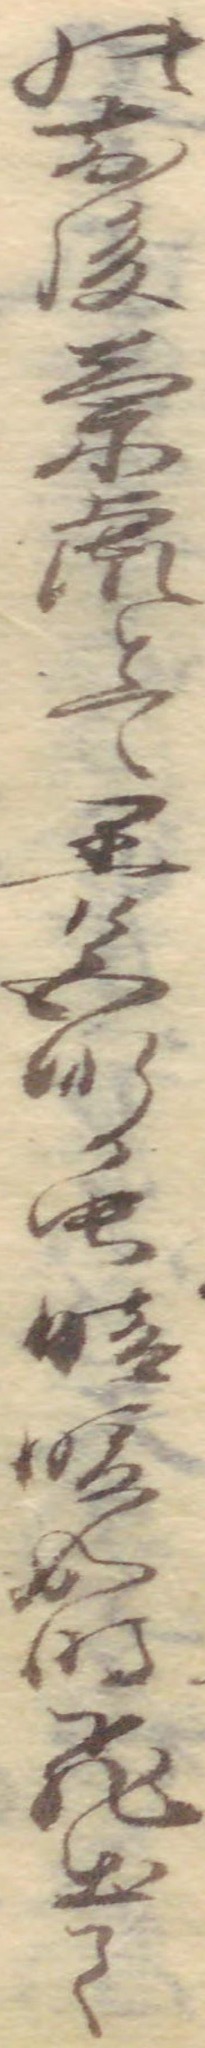の前後菊虎とて黒色なる虫晴暖成時飛出て
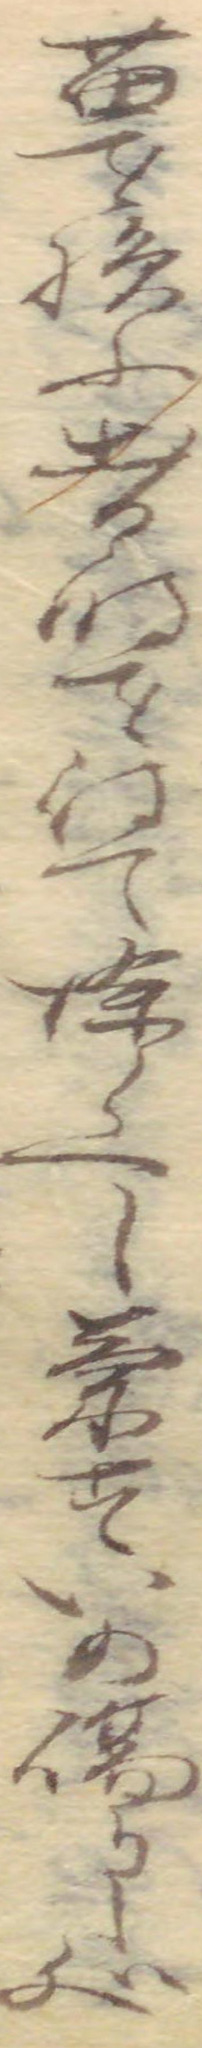苗を損ふ出る時を待て除くへし菊すいの傷りし処
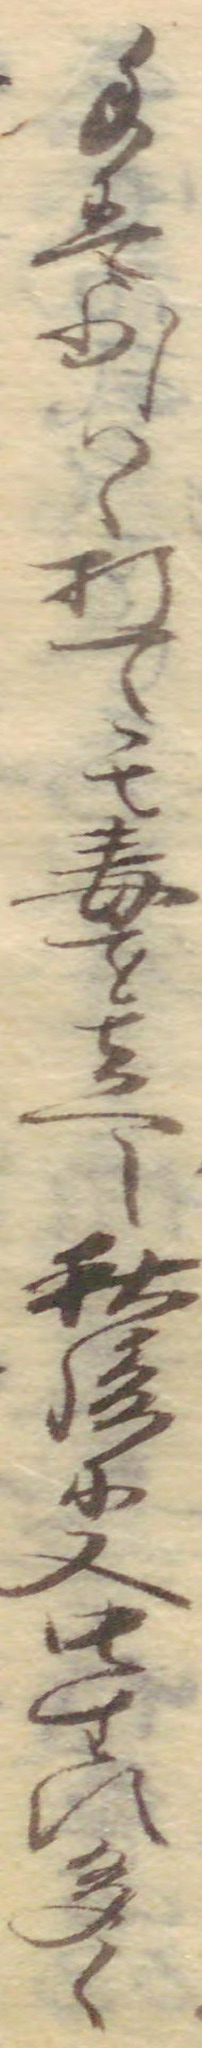手にて少しつゝ打て其毒を去へし秋後に又虫生す多く
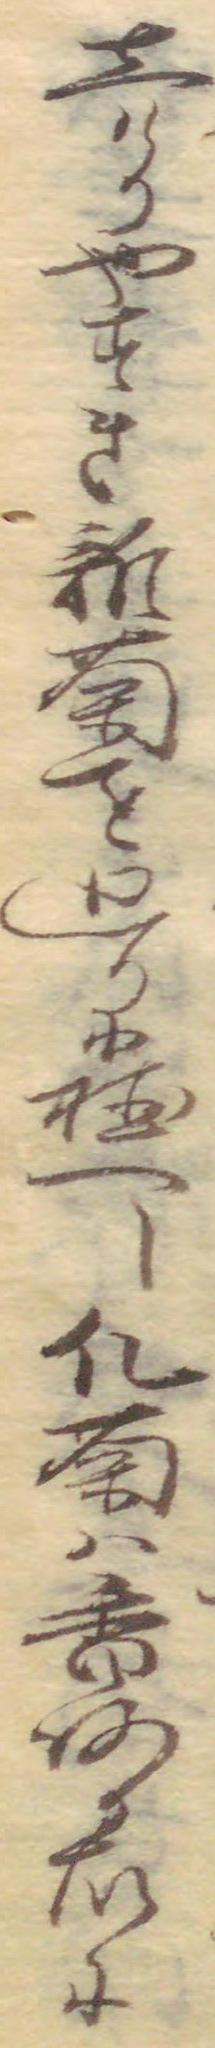しけりやすき新菊を廻りに植へし凡菊ハ香ある故に

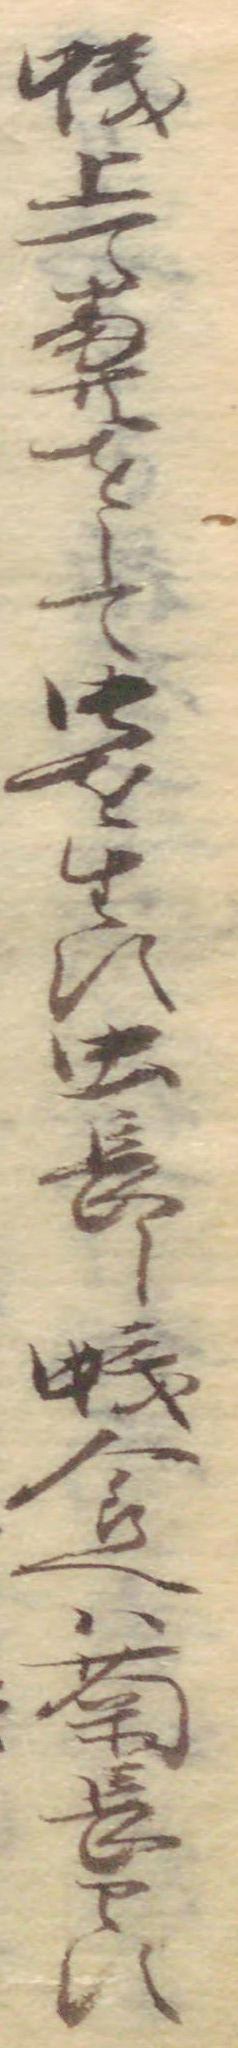蟻上て糞をして虫を生す虫長し蟻食へハ菊長せす
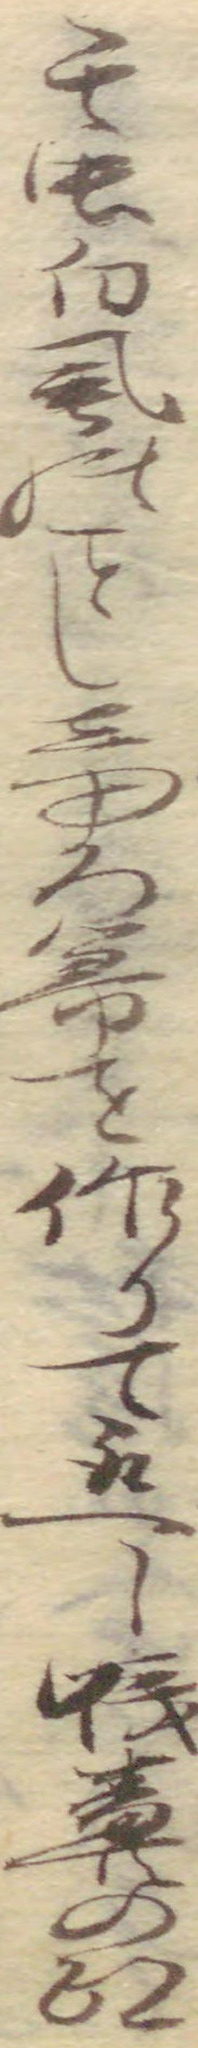此虫白虱のことししゆろ箒を作りて取へし蟻糞の跡
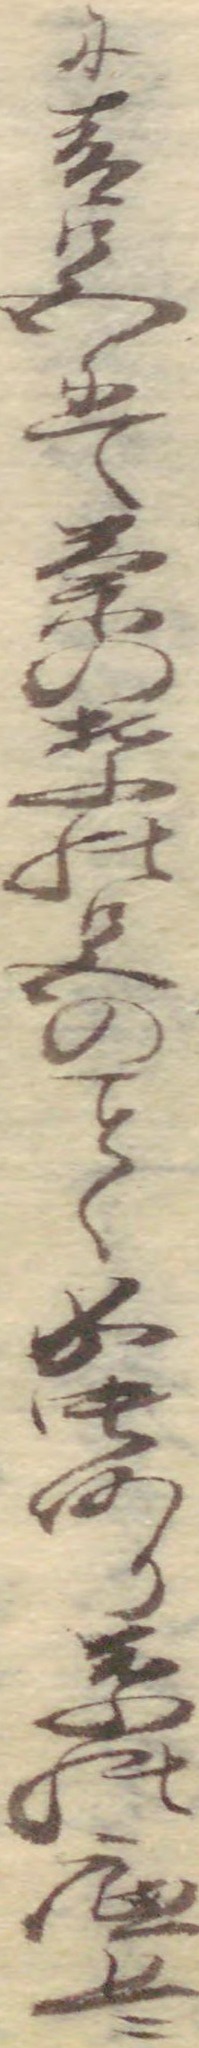に青色にて菊の葉の色のことく成虫あり葉の底上ニ
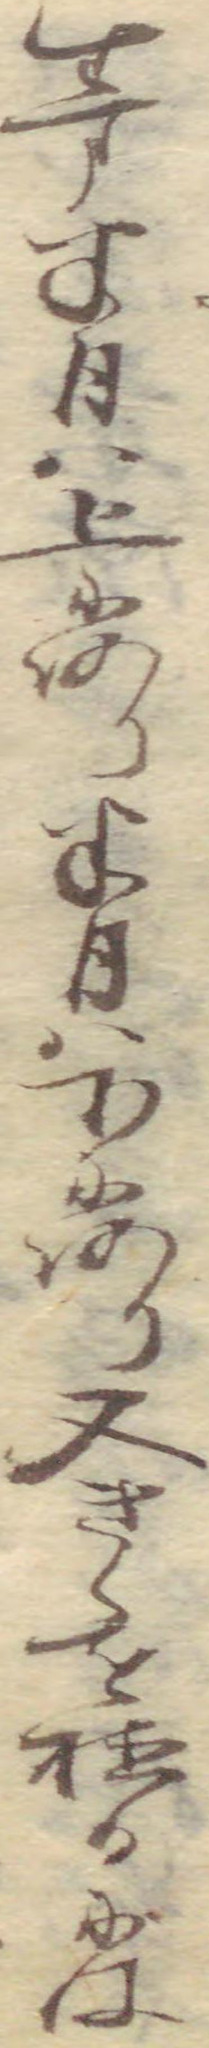生す半月ハ上にあり半月ハ下にあり又きくを植るには
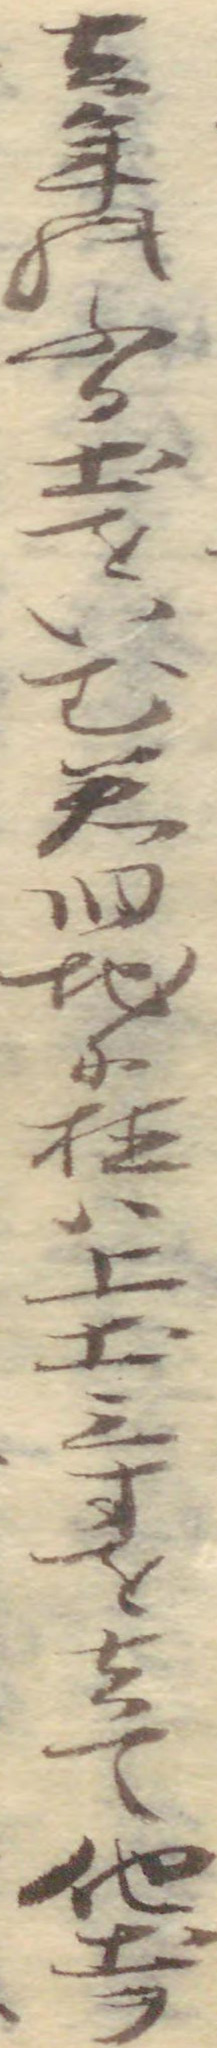去年のふる土をいむ若旧地に植ハ上土三寸を去て他土ヲ
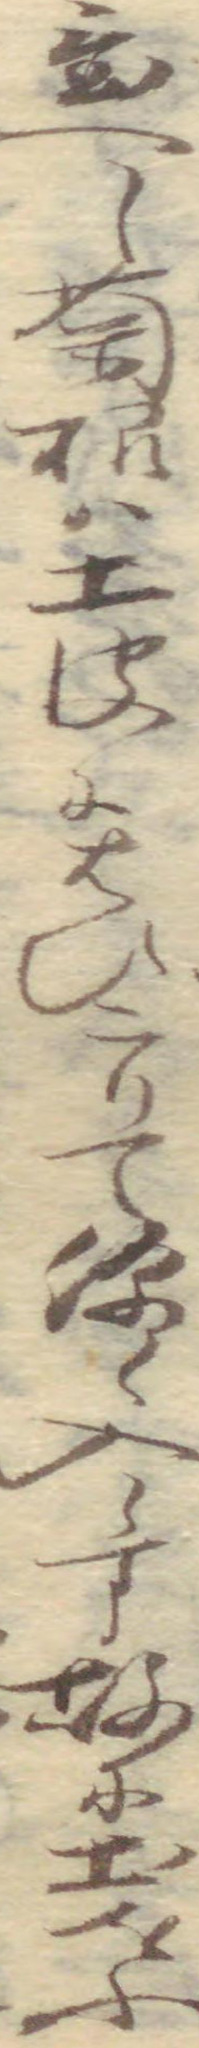置へし菊根ハ土皮にはひこりて深く入らす故に土をふ
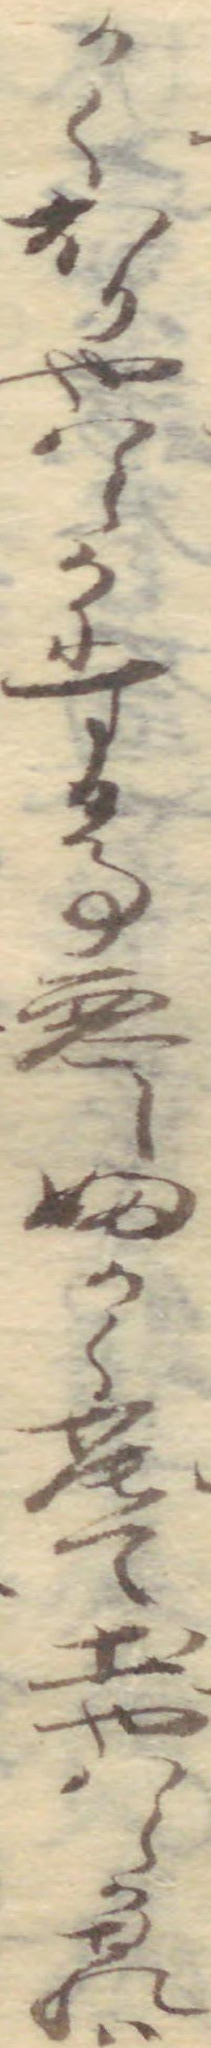かくほりやハらかにする事悪しふかく堀て土やはらかなれハ
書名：鶯宿雑記. 巻199-200
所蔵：国立国会図書館 National Diet Library, JAPAN
